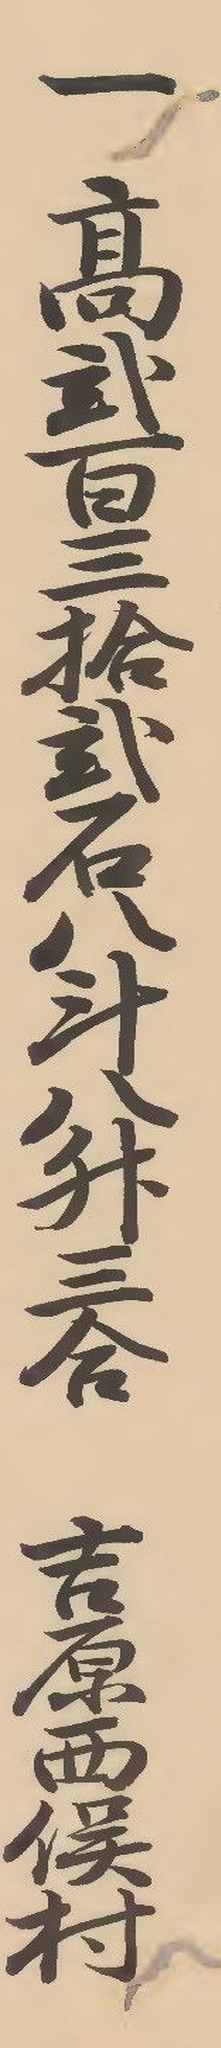一高弐百三拾弐石八斗八升三合吉原西俣村
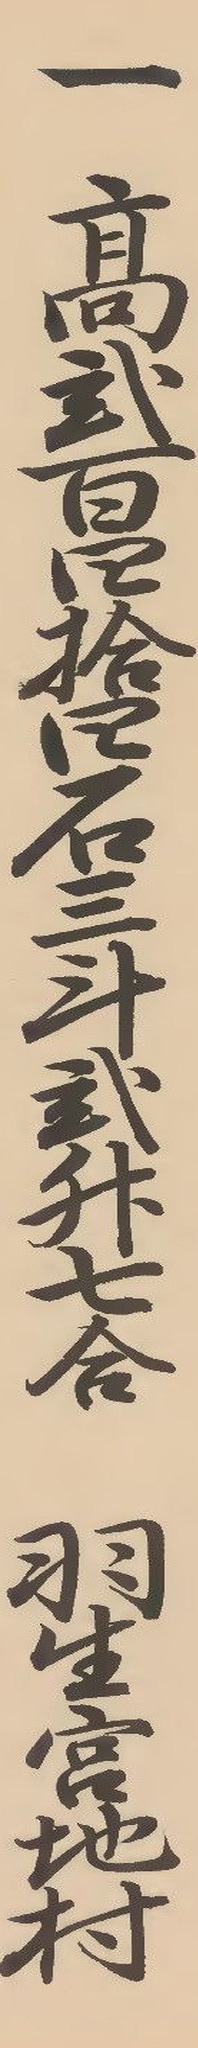一高弐百四拾四石三斗弐升七合羽生宮地村
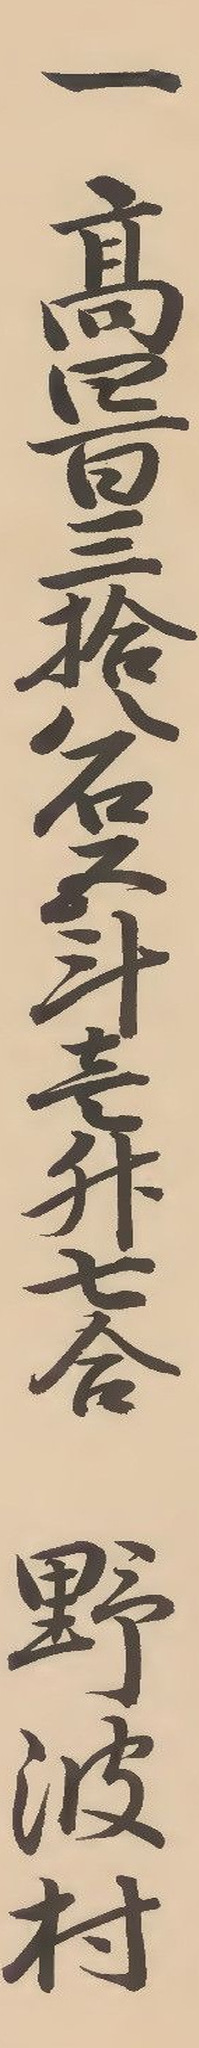一高四百三拾八石五斗壱升七合野波村
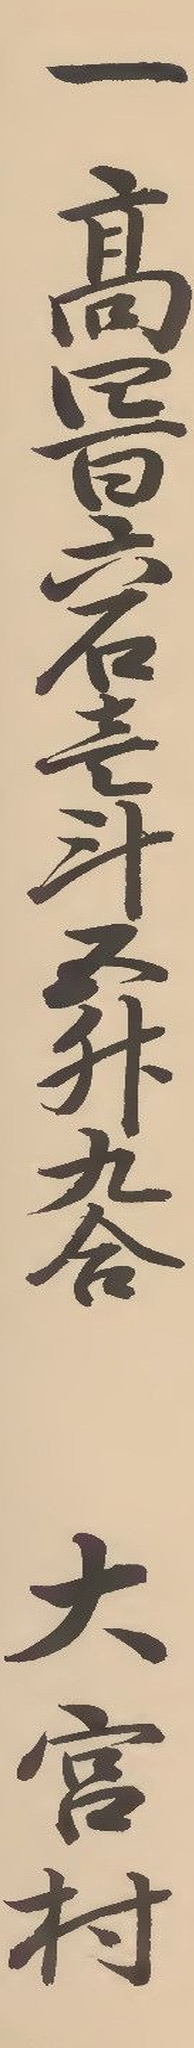一高四百六石壱斗五升九合大宮村
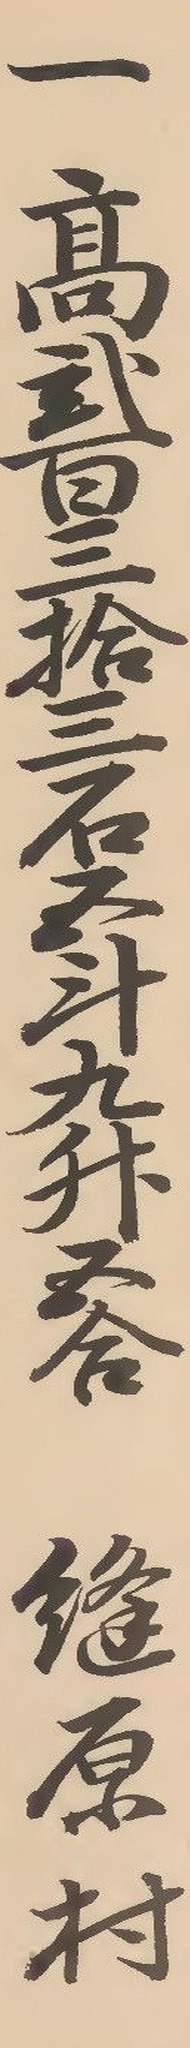一高弐百三拾三石五斗九升五合縫原村
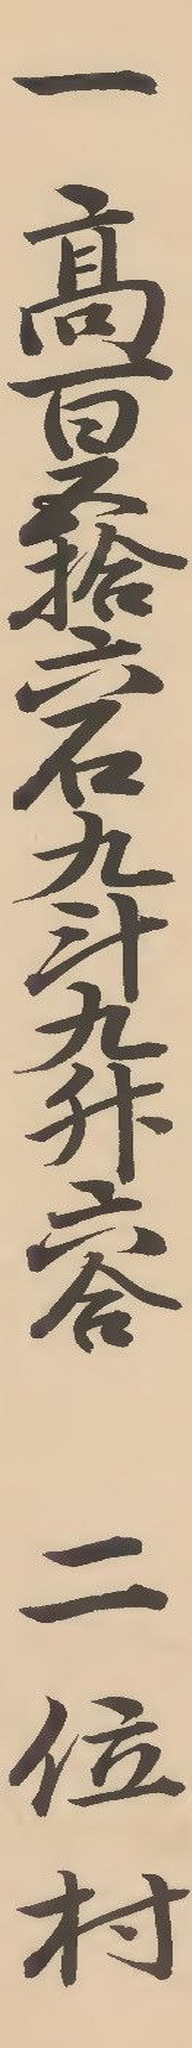一高百五拾六石九斗九升六合二位村
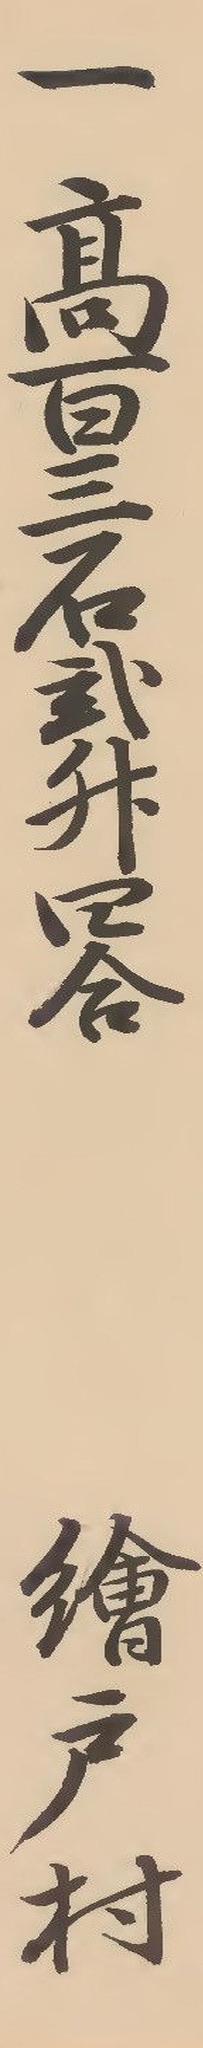一高百三石弐升四合絵戸村

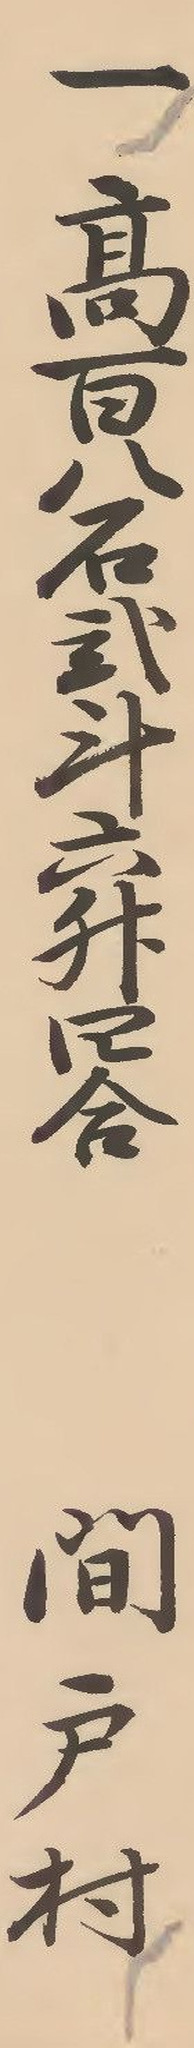一高百八石弐斗六升四合間戸村
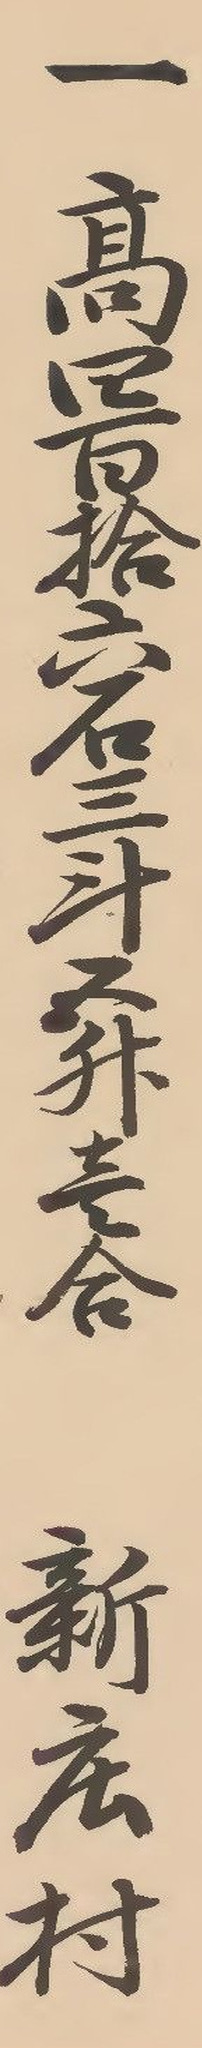一高四百拾六石三斗五升壱合新庄村
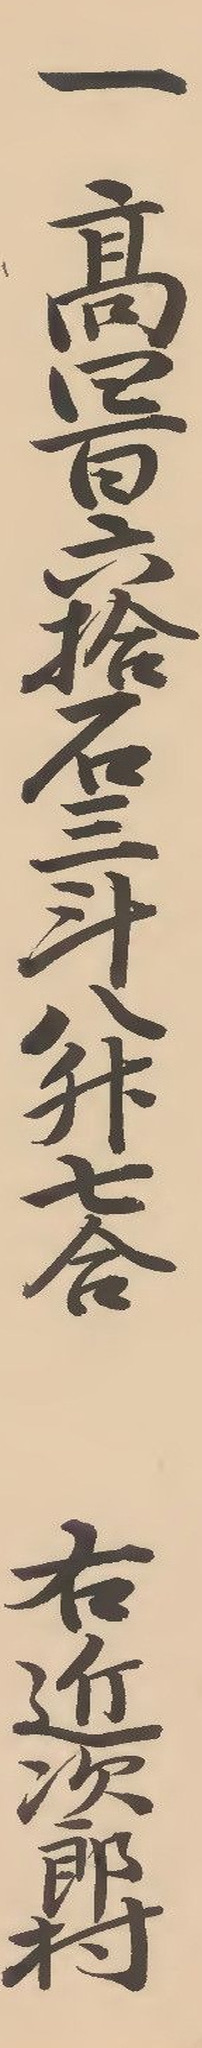一高四百六拾石三斗八升七合右近次郎村
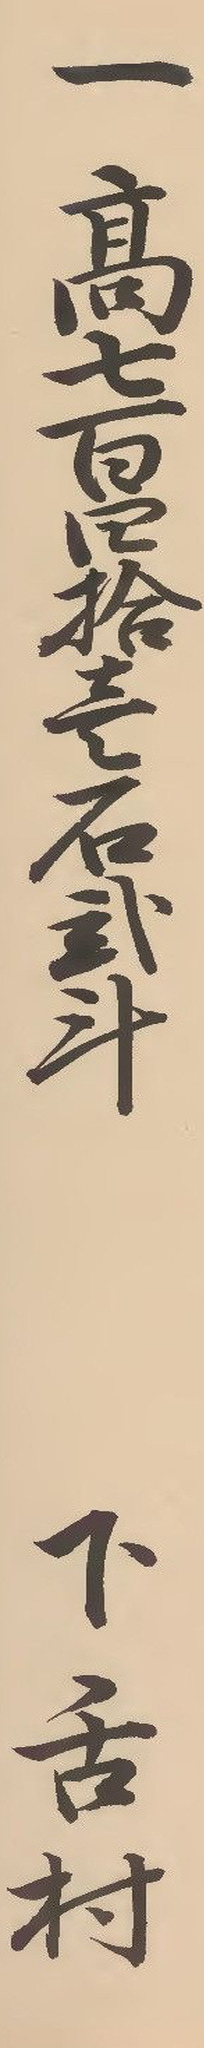一高七百四拾壱石弐斗下舌村
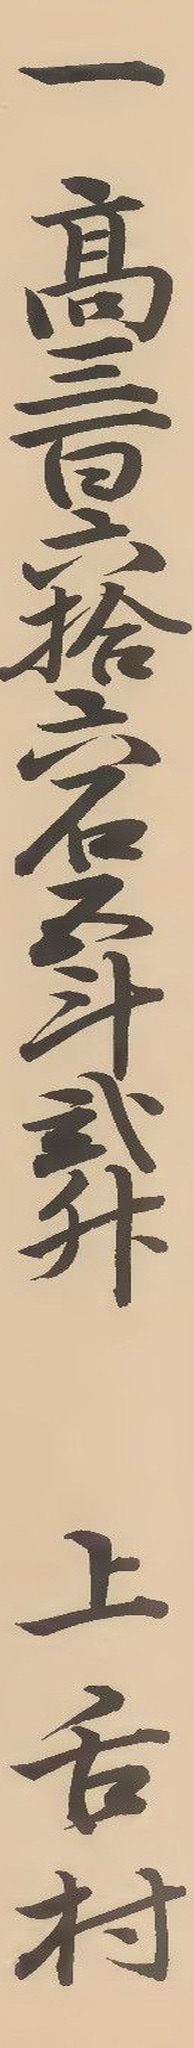一高三百六拾六石五斗弐升上舌村
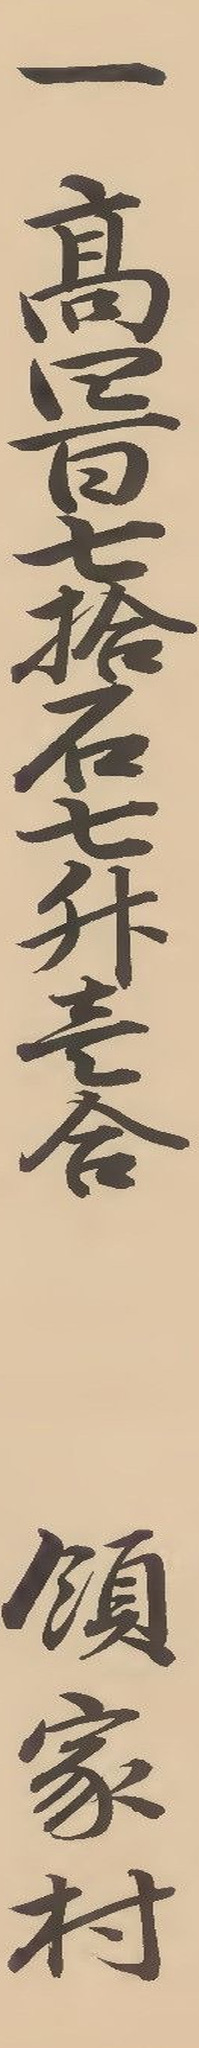一高四百七拾石七升壱合領家村
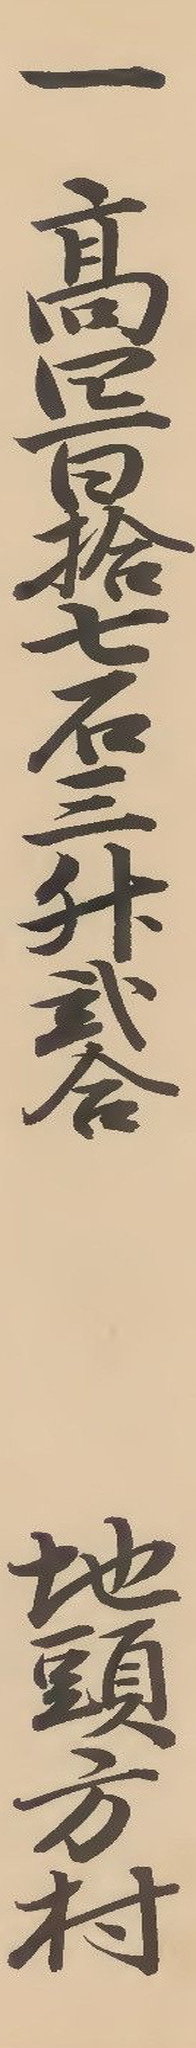一高四百拾七石三升弐合地頭方村
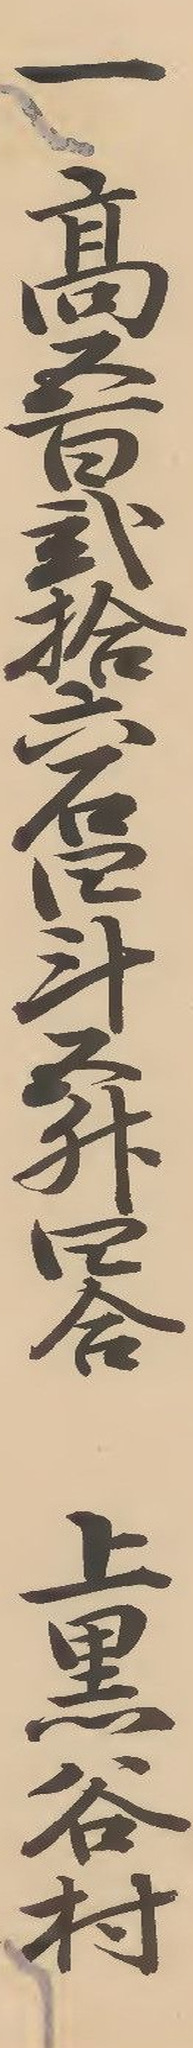一高五百弐拾六石四斗五升四合上黒谷村

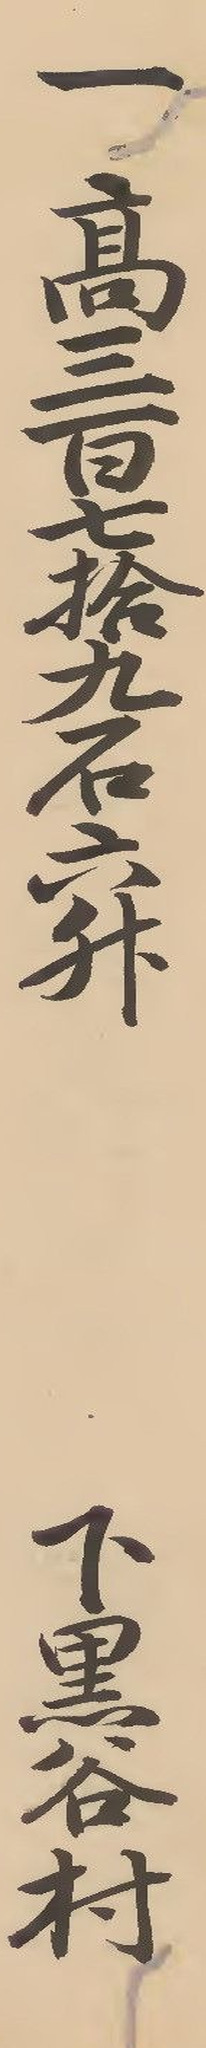一高三百七拾九石六升下黒谷村
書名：越前国郷帳
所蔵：国立公文書館 National Archives of Japan
